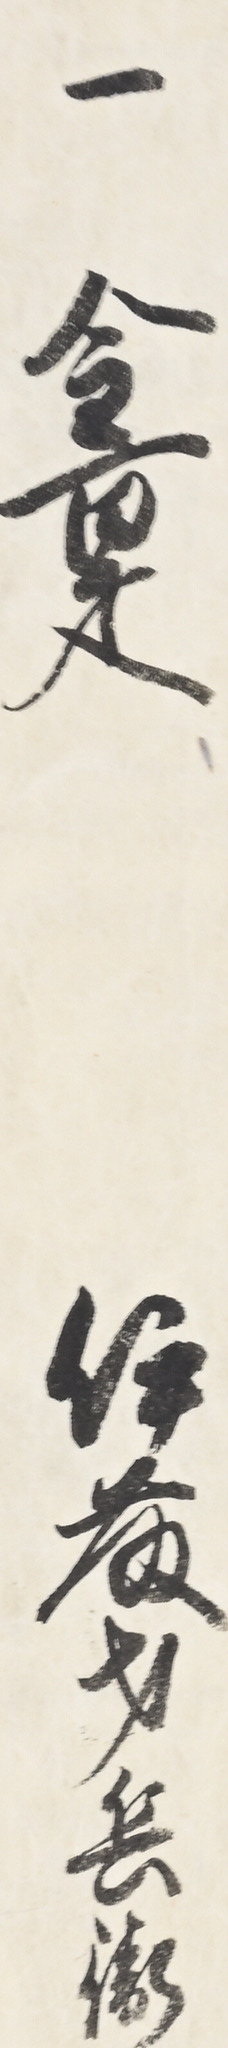一金百疋伊藤才兵衛
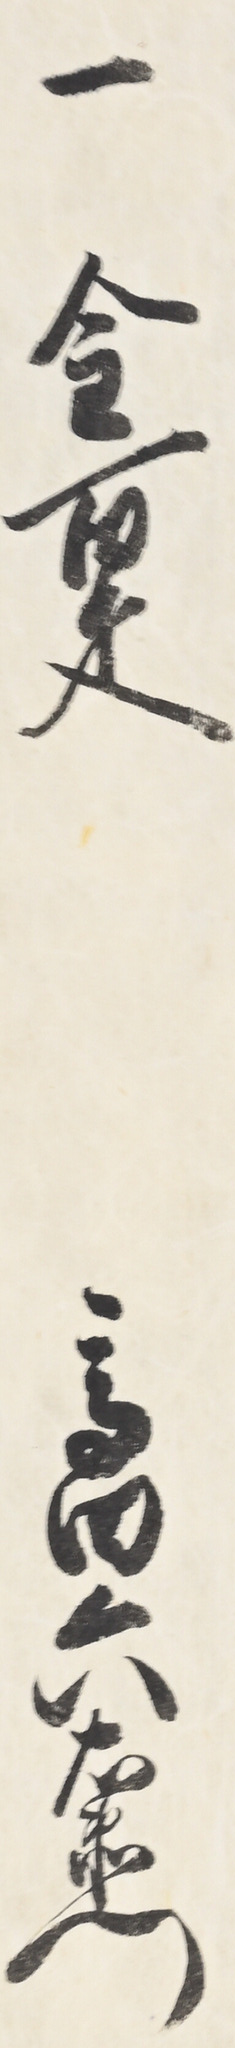一金百疋高田六右衛門
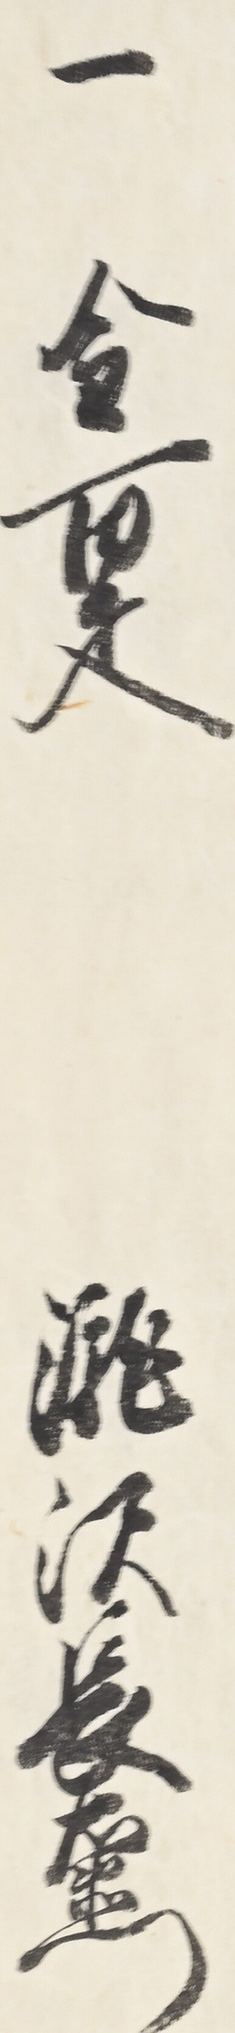一金百疋瀧沢長右衛門
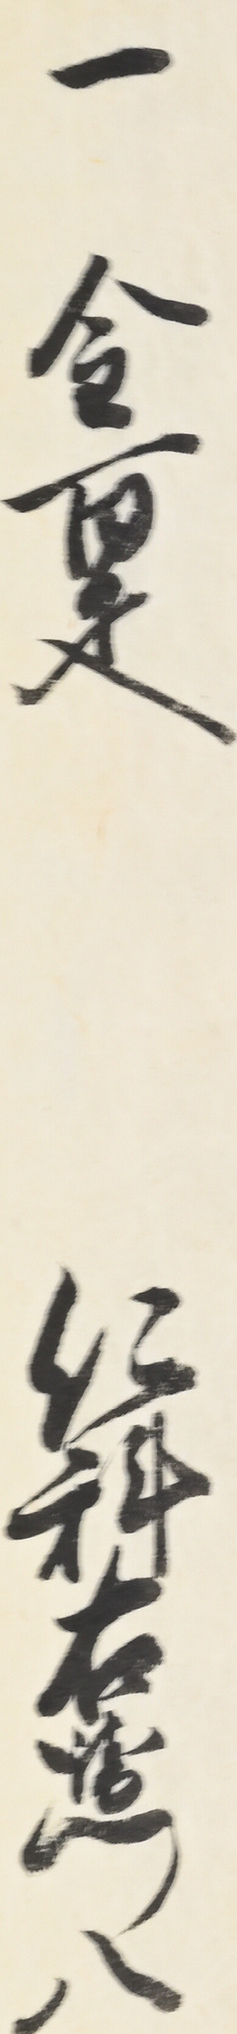一金百疋仁科右衛門八
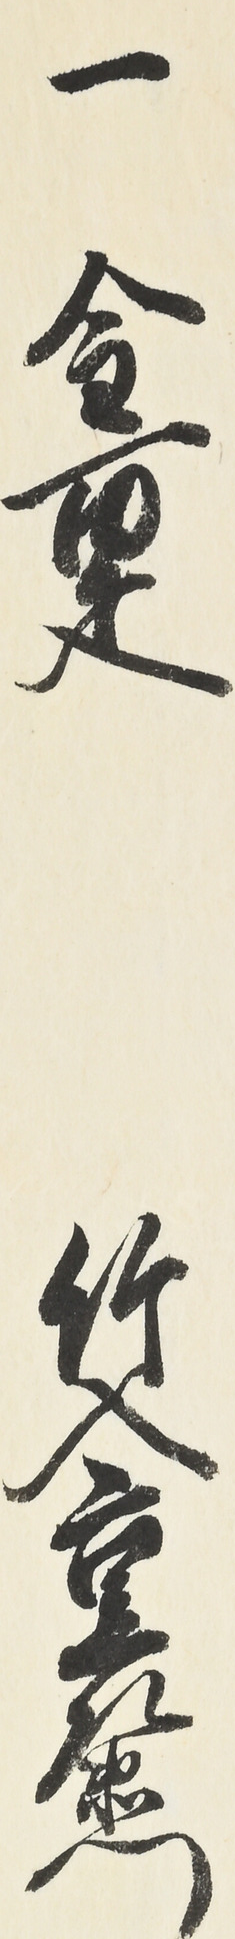一金百疋竹入左衛門
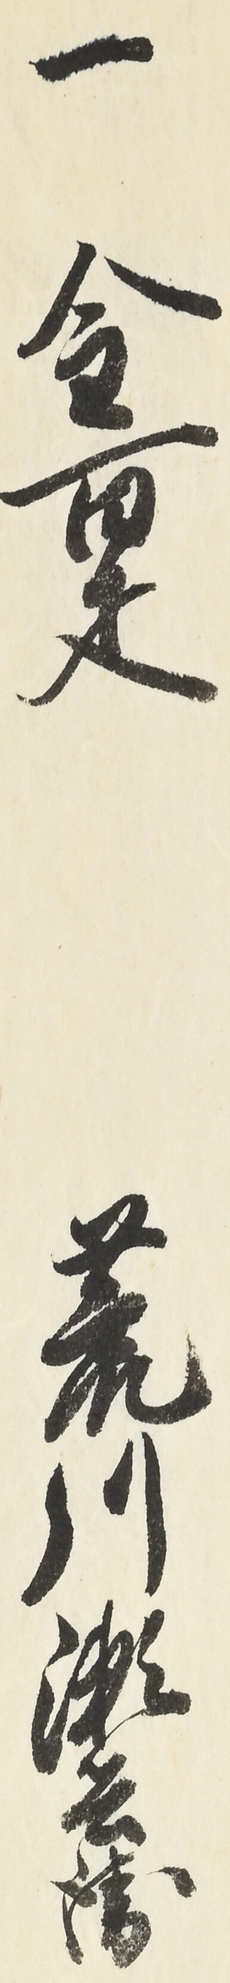一金百疋荒川瀬兵衛
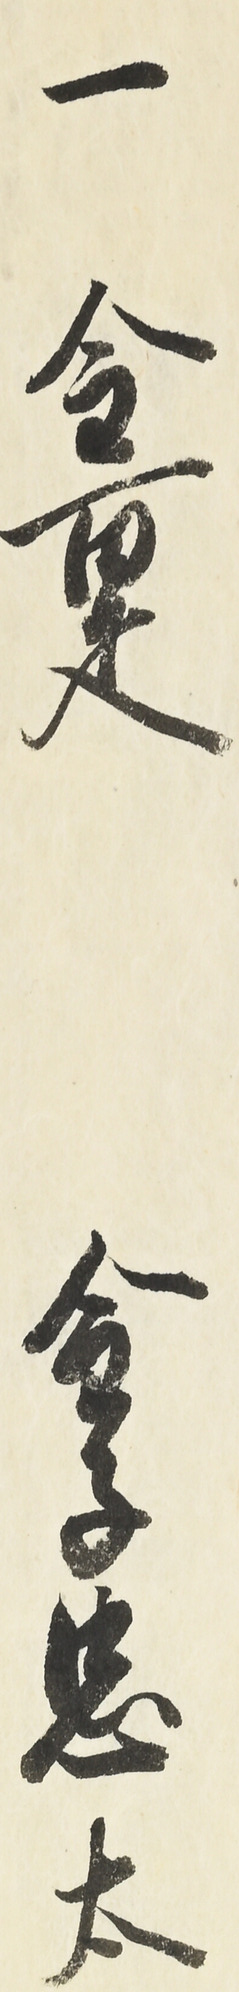一金百疋金子忠太
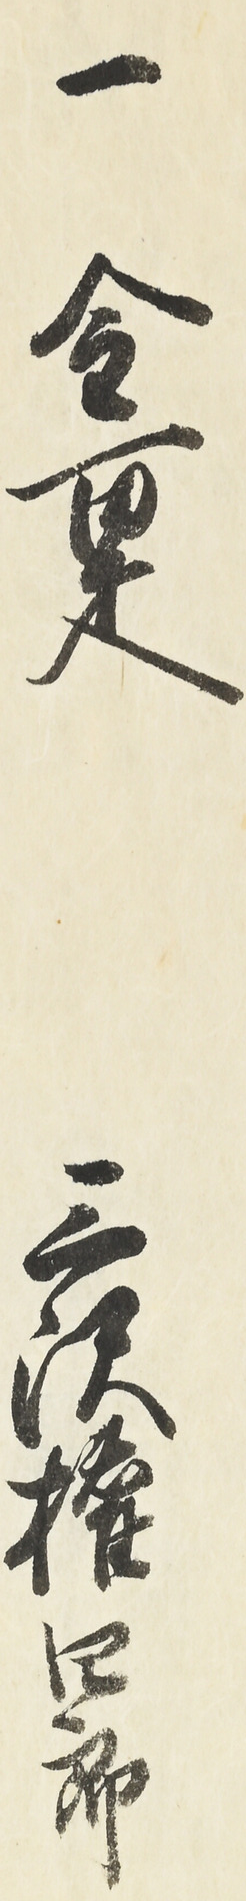一金百疋三沢権四郎

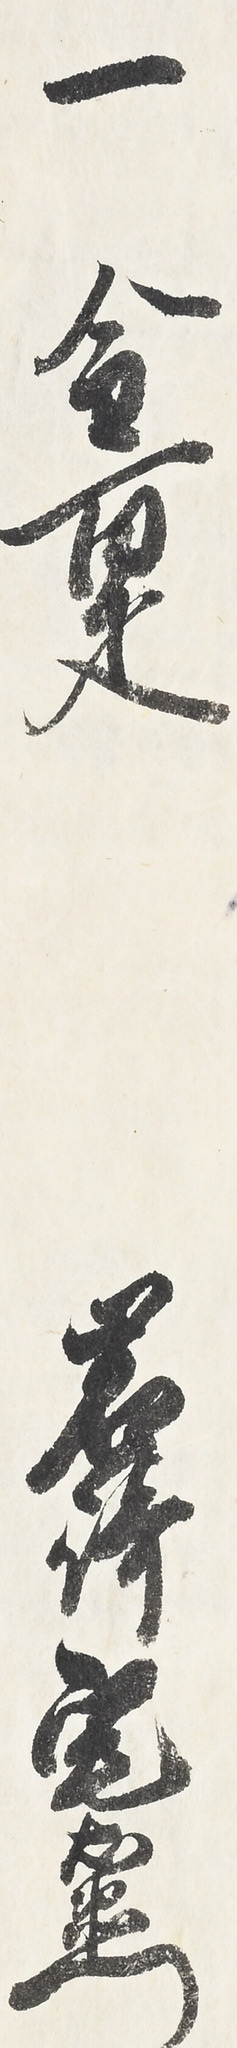一金百疋岩崎宅右衛門
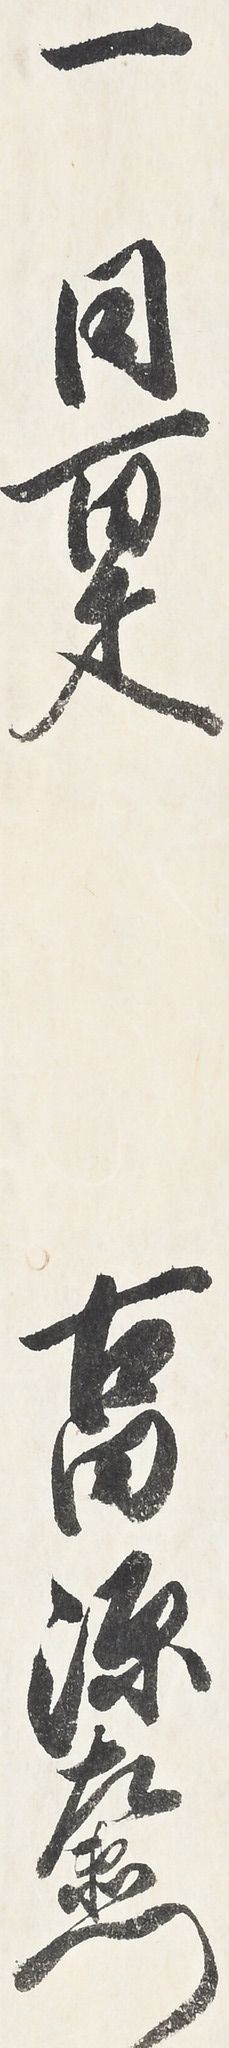一同百疋古田源左衛門
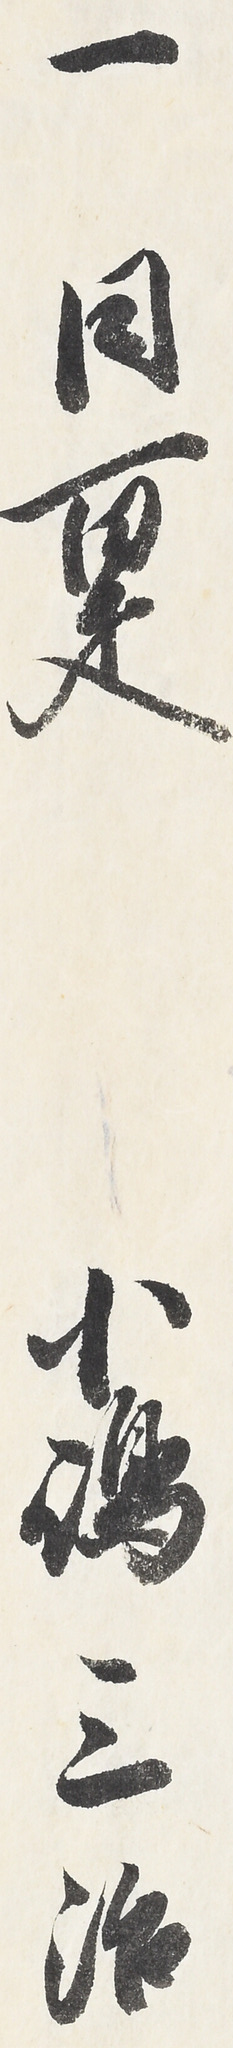一同百疋小嶋三治
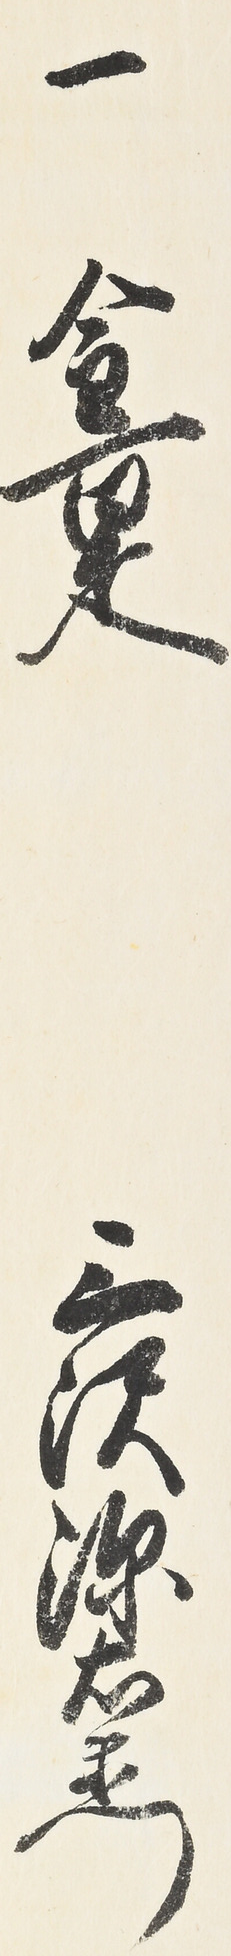一金百疋三沢源右衛門
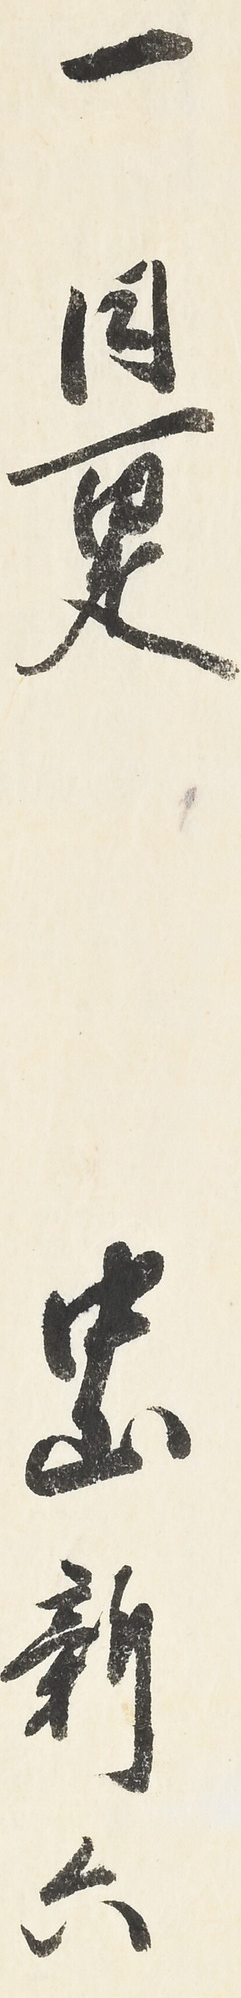一同百疋中山新六
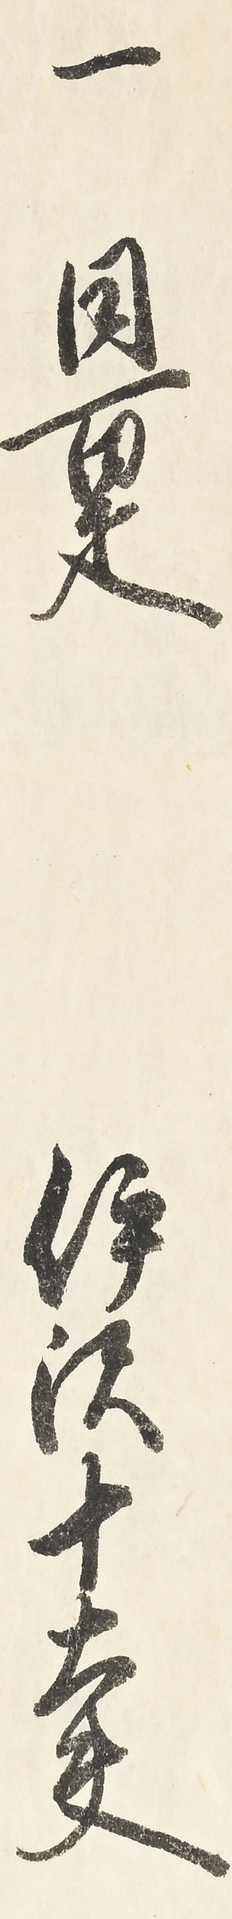一同百疋伊沢十大夫

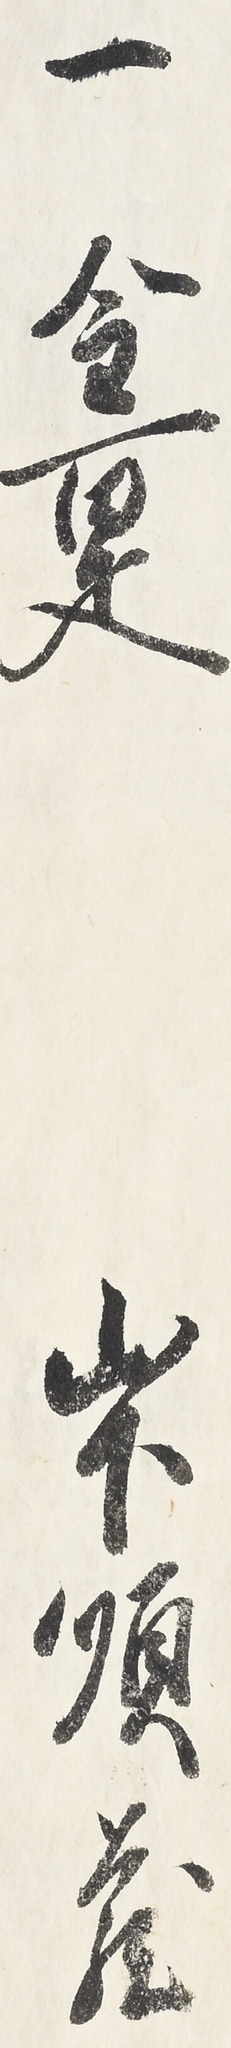一金百疋山下順蔵
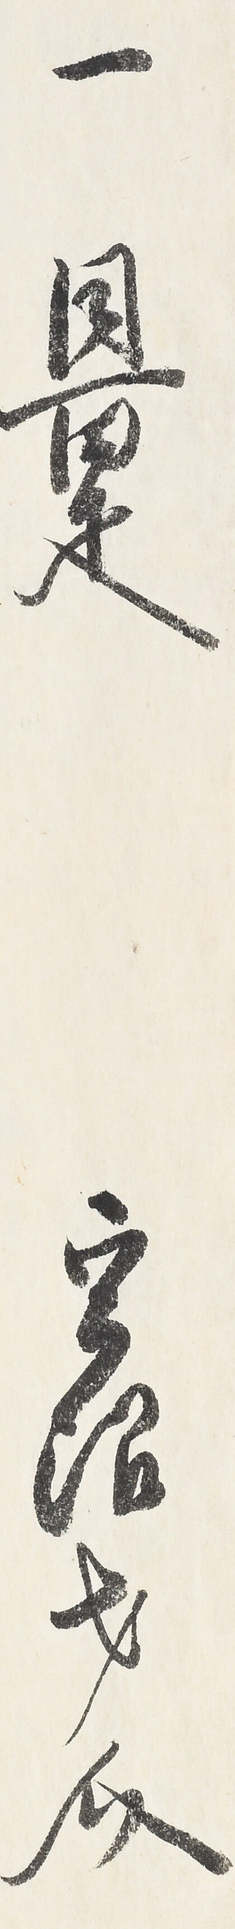一同百疋宇沼才介
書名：永代太々御神楽名前帳
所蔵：伊那市立高遠町図書館・合同会社AMANE
